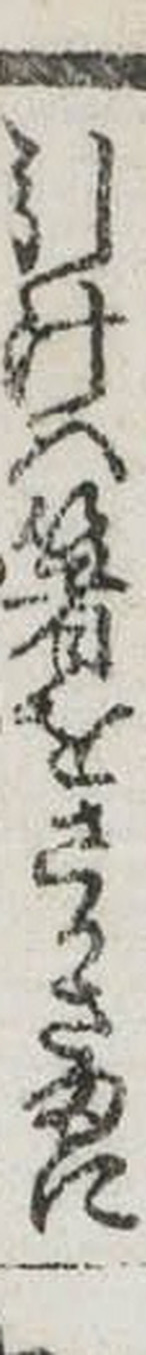引汁は箸をさかさまに
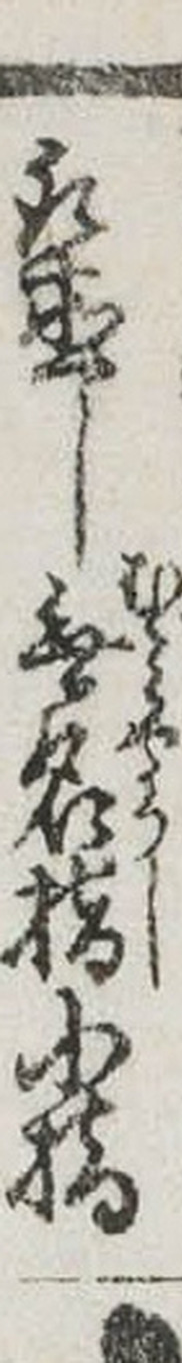取直し無名指小指
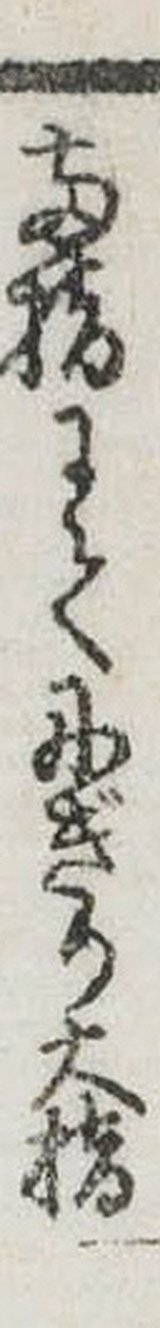両指にてにぎり大指
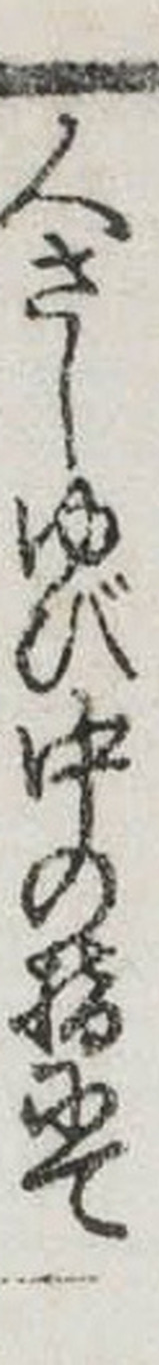人さしゆび中の指にて
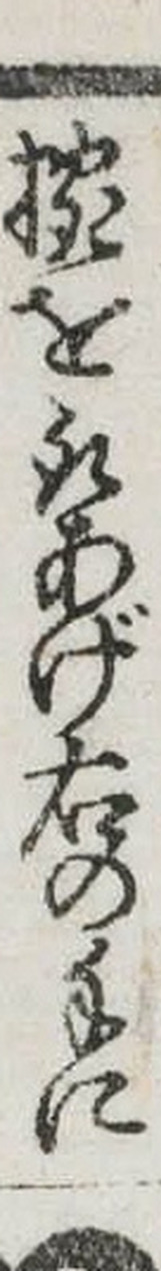椀を取あげ右の手に
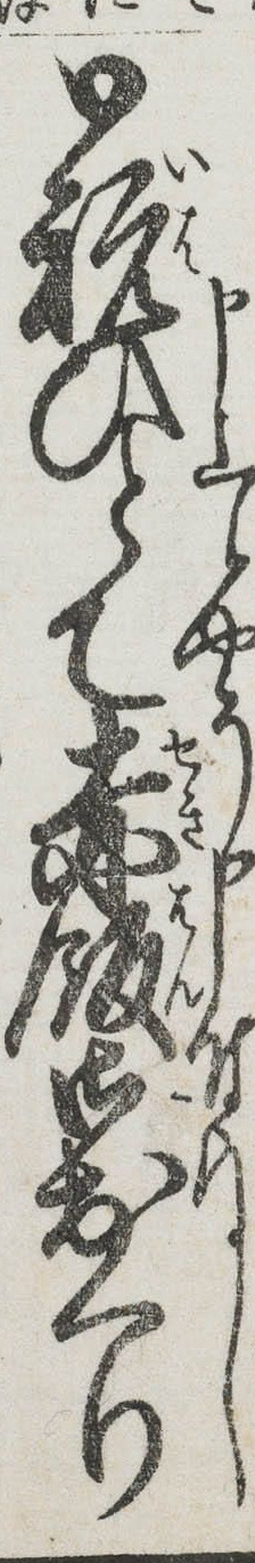御祝ひとて赤飯御おくり
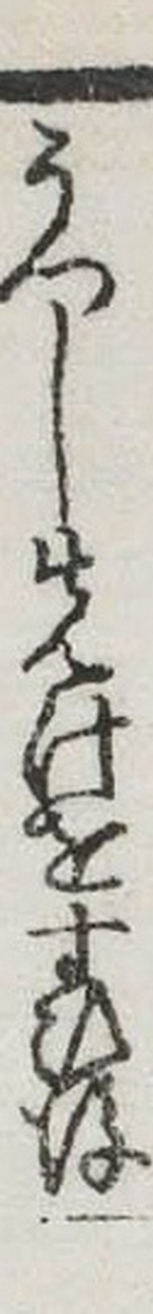うつし先汁をすひ後
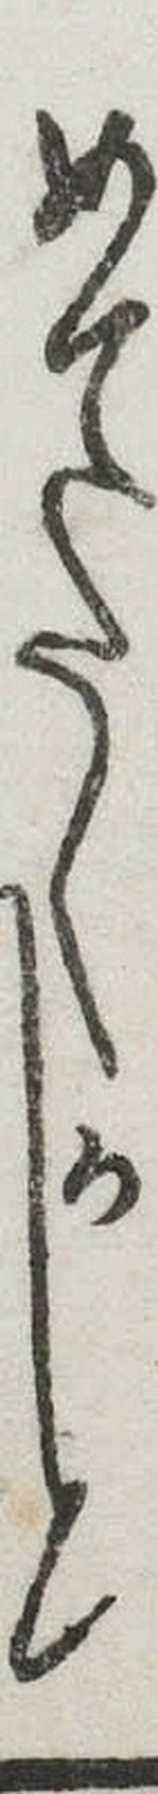めてたくかしく
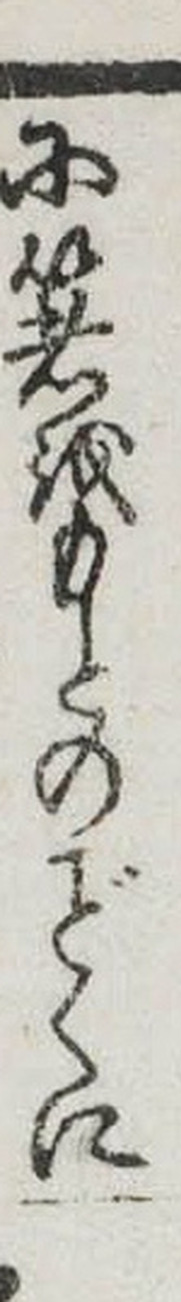に箸をもとのごとくに
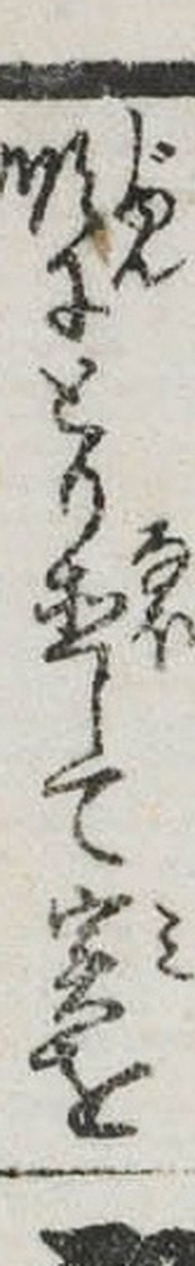順にとり直して実を
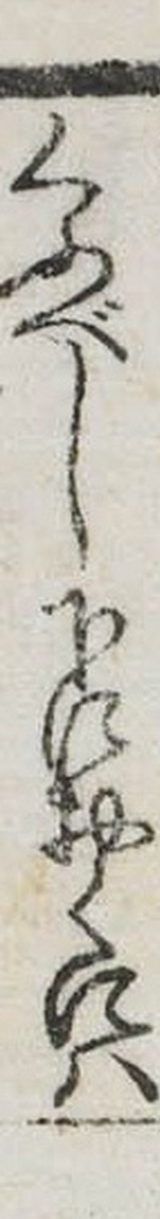くふべし下におくには
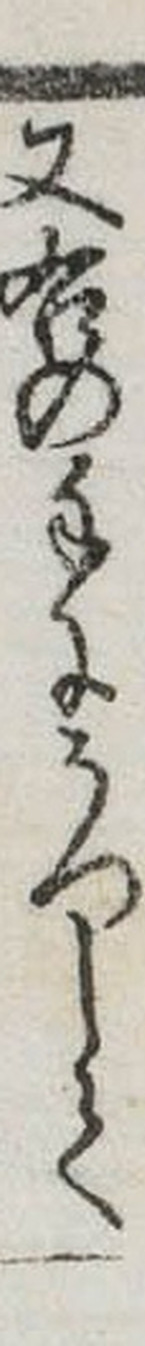又右の手にうつして
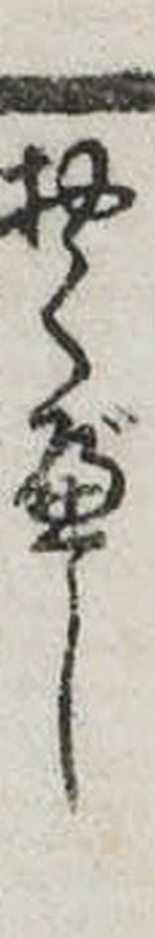おくべし
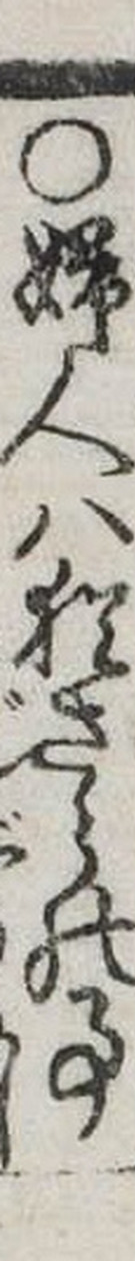○婦人は猶さらの事
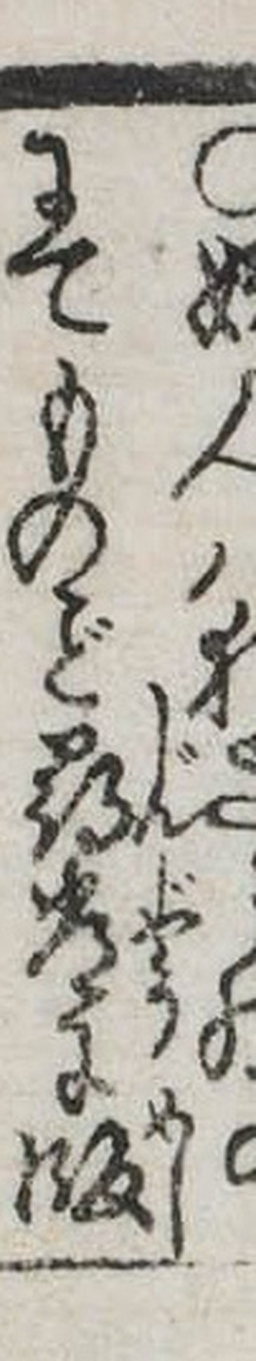にてものごと尋常に飯
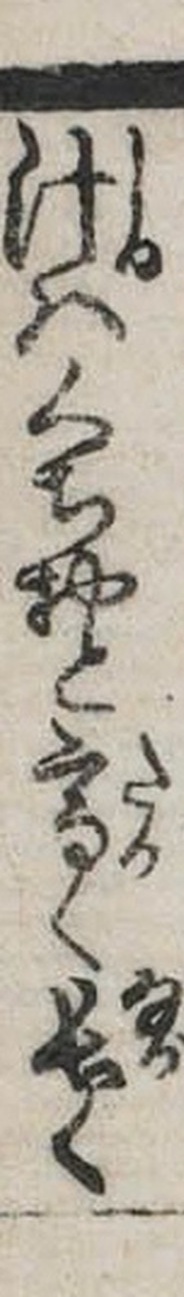汁はくちおと高く長く
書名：頭書萬用婦人手紙之文言
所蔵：東京学芸大学教育コンテンツアーカイブ
